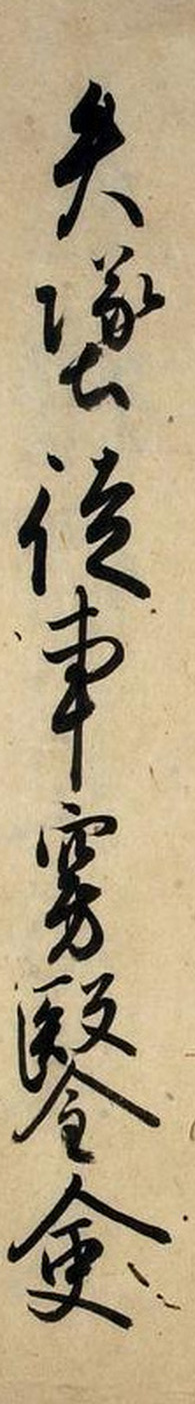失墜徒事穿鑿僉
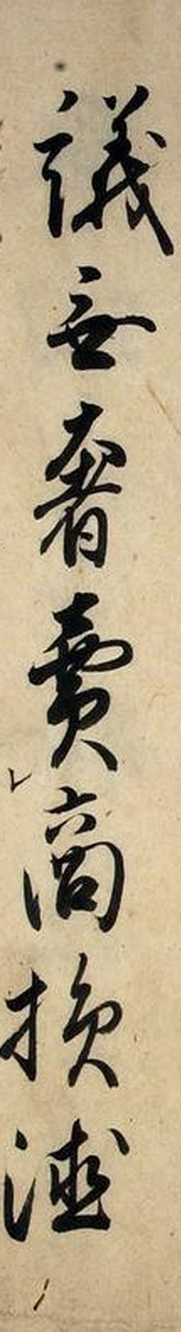議無奢売商損徳

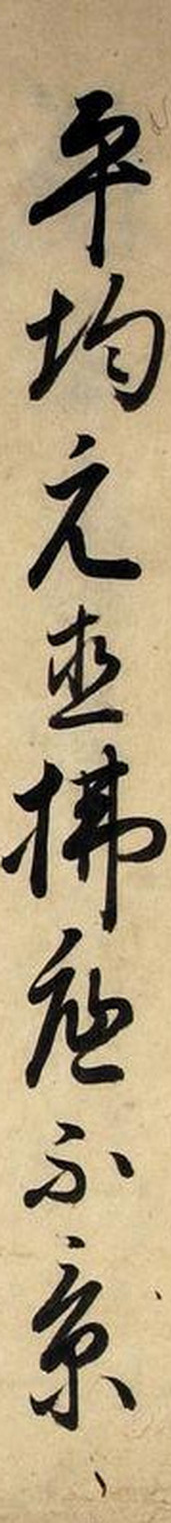平均元直払底不景
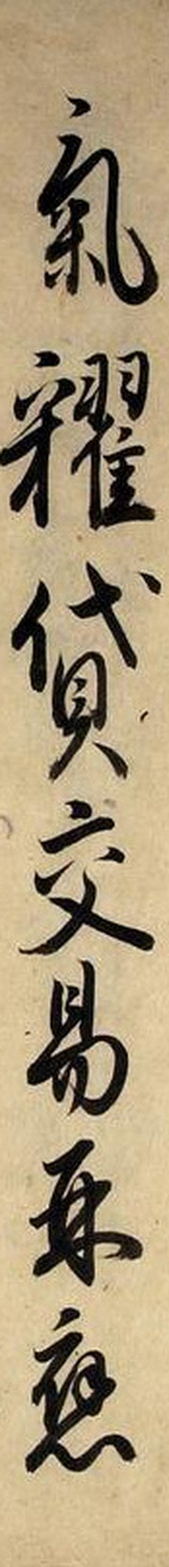気䊮貸交易再応
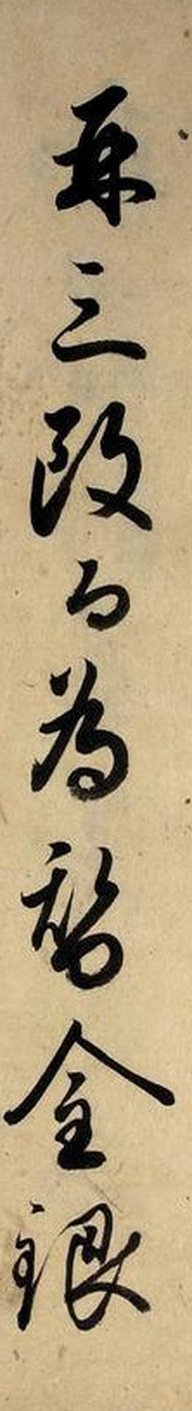再三改而為替金銀
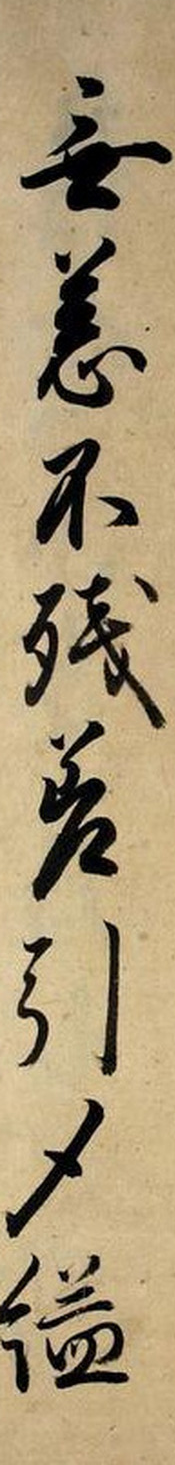無恙不残差引〆縊
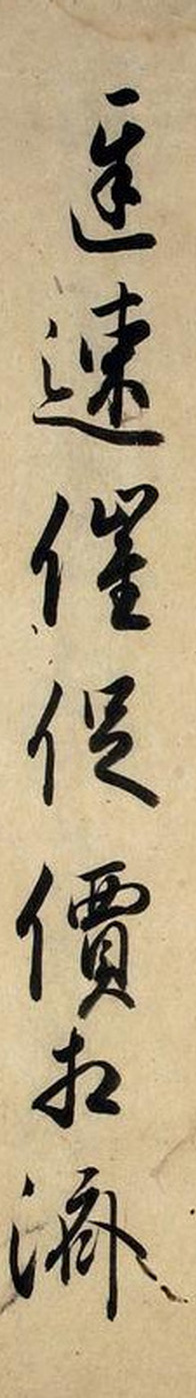遅速催促価相済
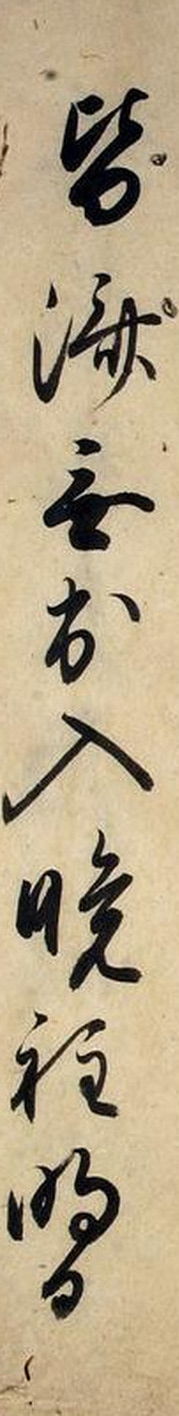皆済無出入晩程明日

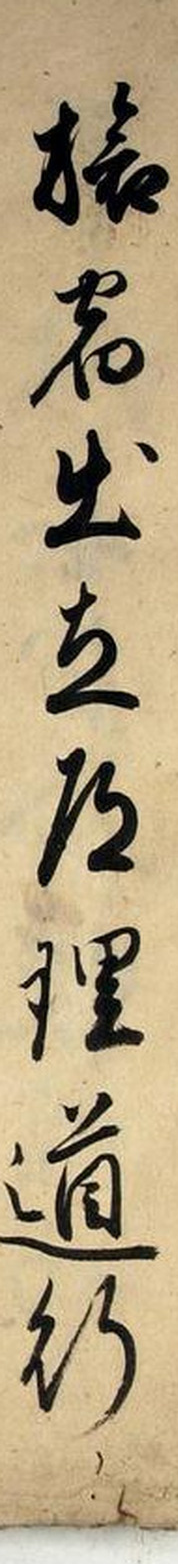旅宿出立道理道行
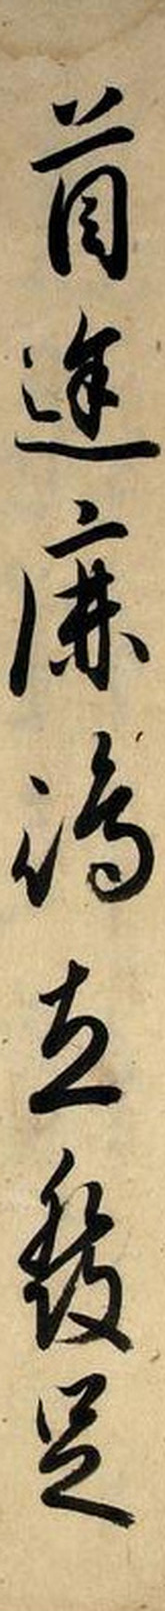首途鹿嶋立発足
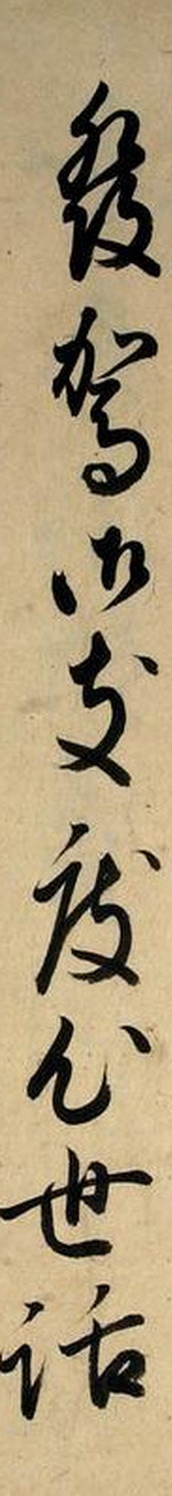発駕御支度心世話
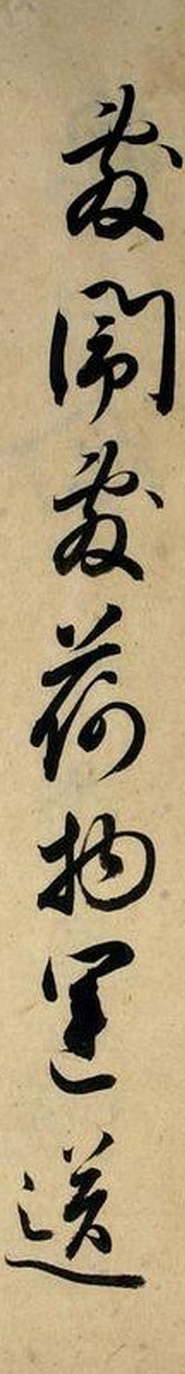敷閙敷荷物運送
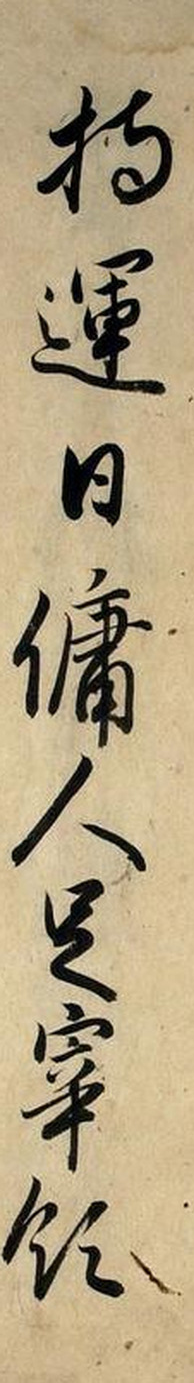持運日傭人足宰領
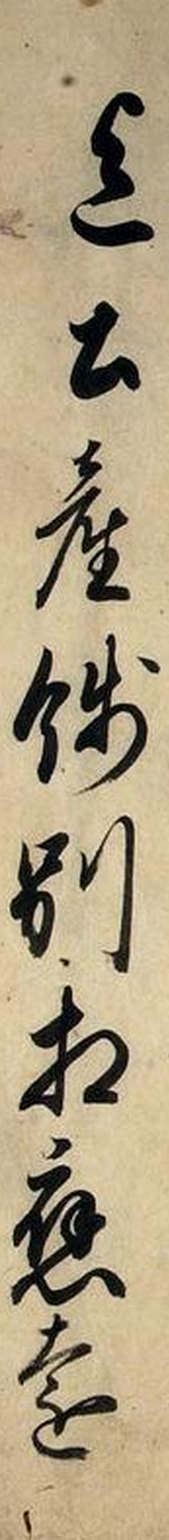迄土産銭別相応遠

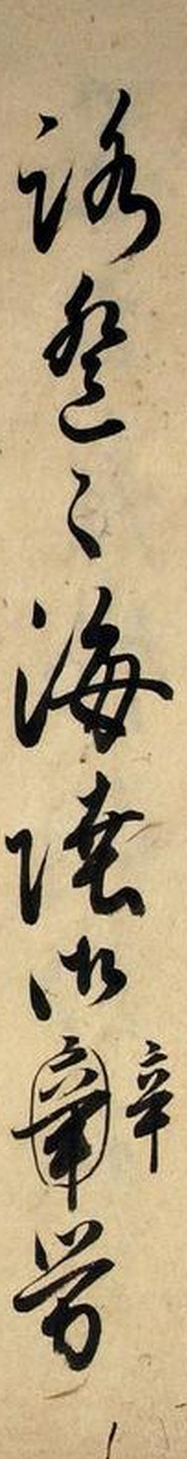路遥々海陸御辛労
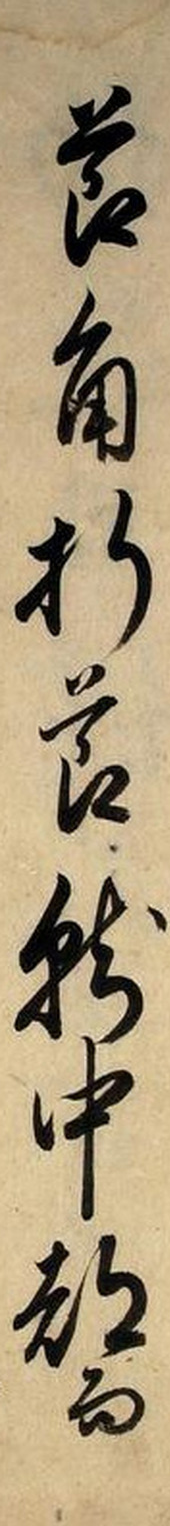節角折節就中都而
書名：消息千字文（往来物、手習手本）
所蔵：福井県文書館 Fukui Prefectural Archives
